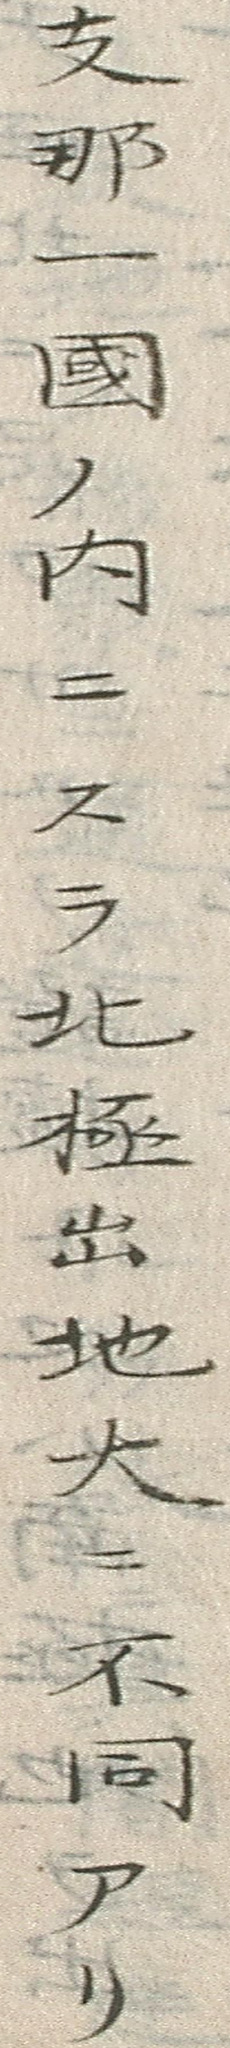支那一国ノ内ニスラ北極出地大ニ不同アリ
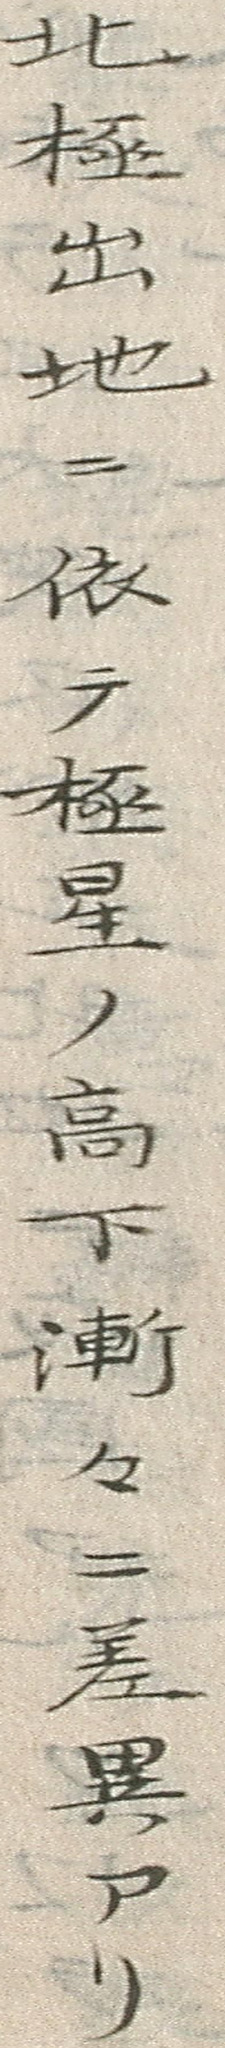北極出地ニ依テ極星ノ高下漸々ニ差異アリ
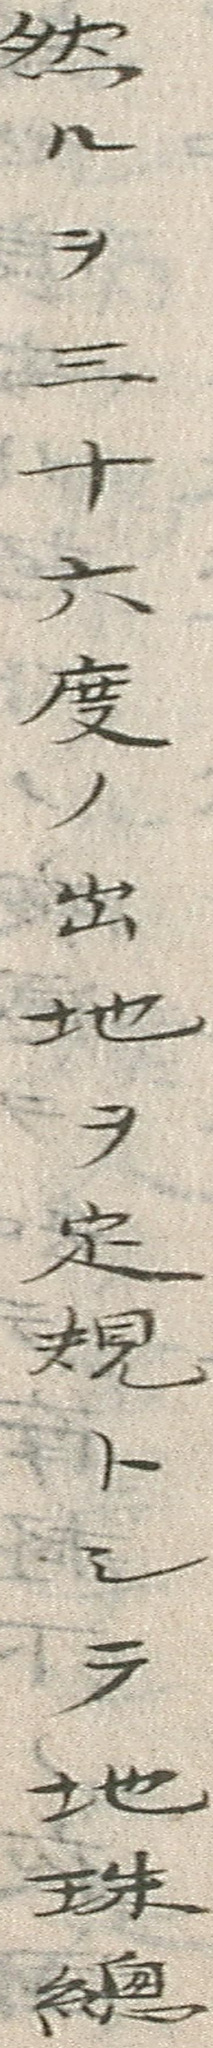然ルヲ三十六度ノ出地ヲ定規トシテ地球総
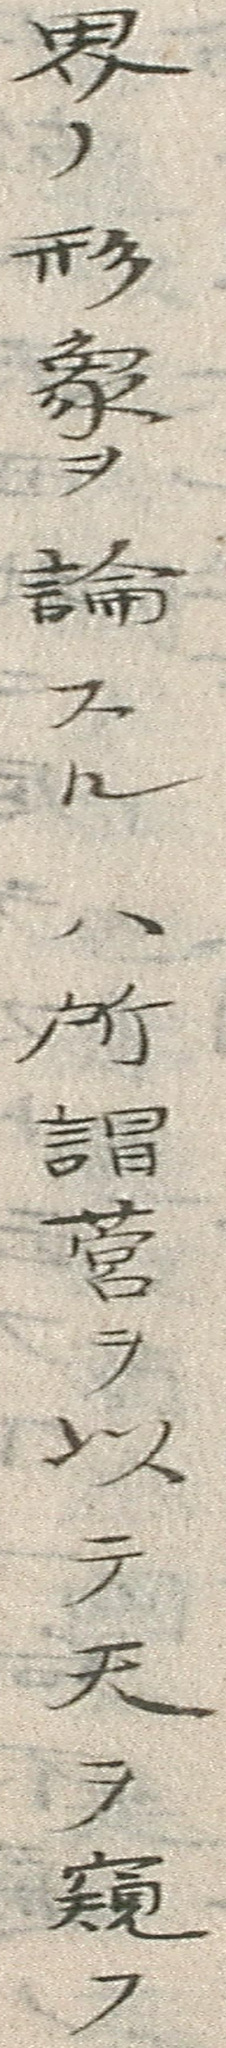界ノ形象ヲ論スルハ所謂菅ヲ以テ天ヲ窺フ
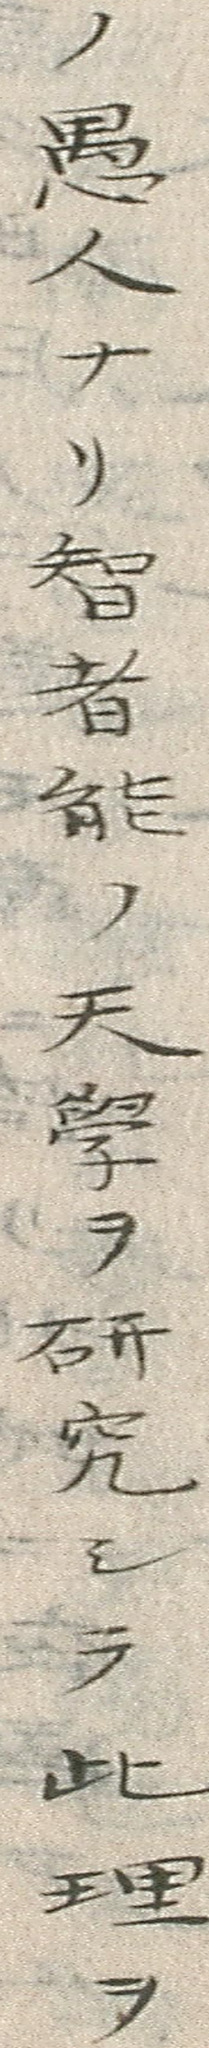ノ愚人ナリ智者能ノ天学ヲ研究シテ此理ヲ
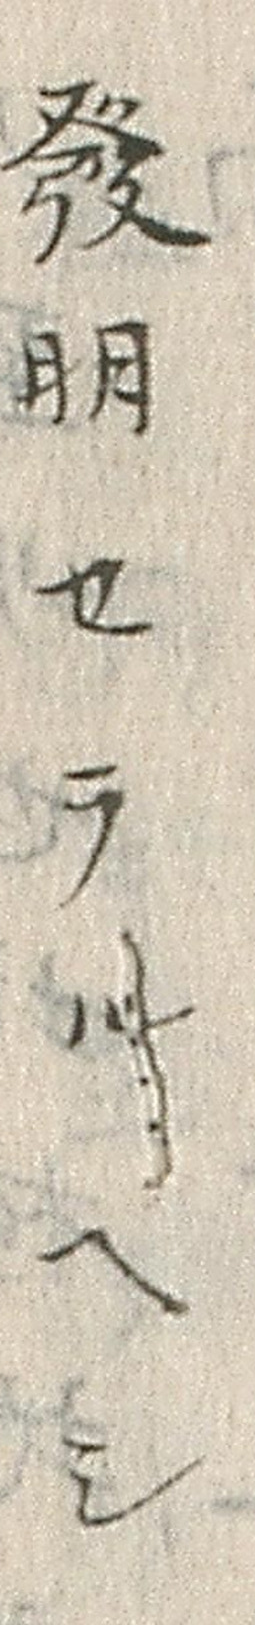発明セラルヘシ
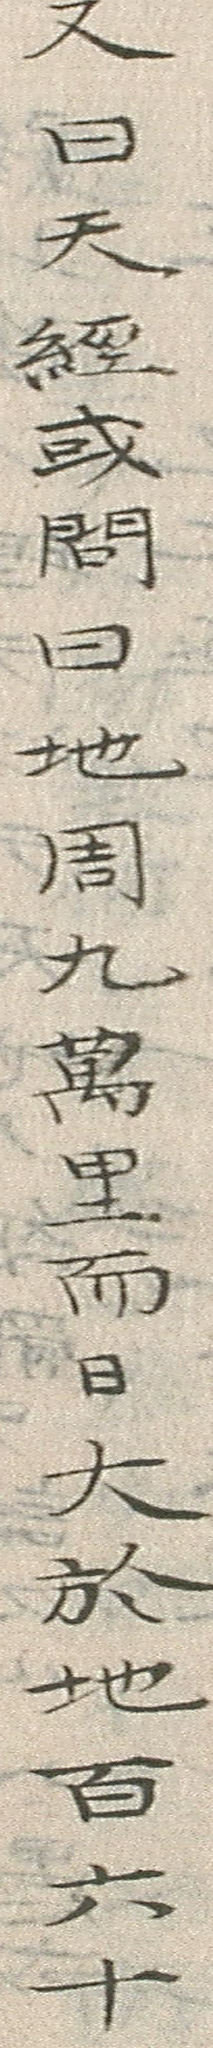又曰天経或問曰地周九万里而日大於地百六十
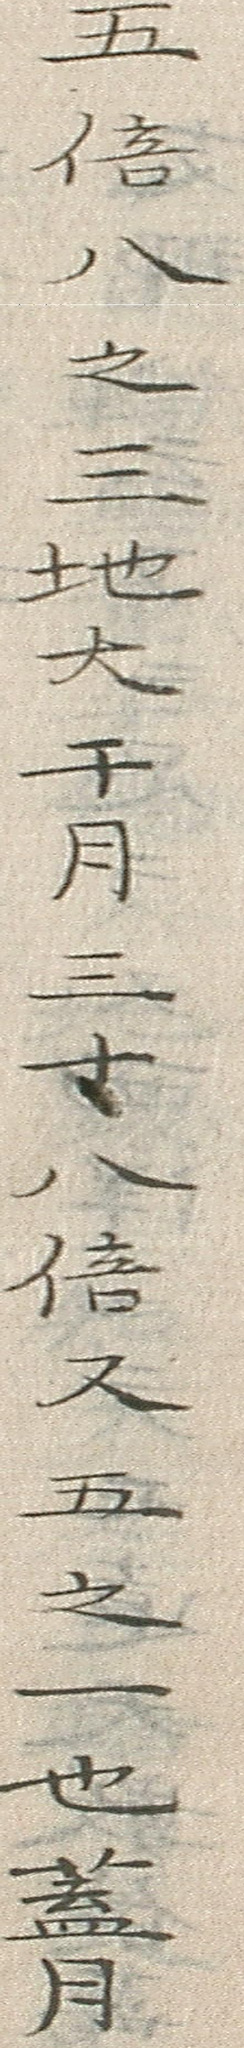五倍八之三地大干月三十八倍又五之一也蓋月
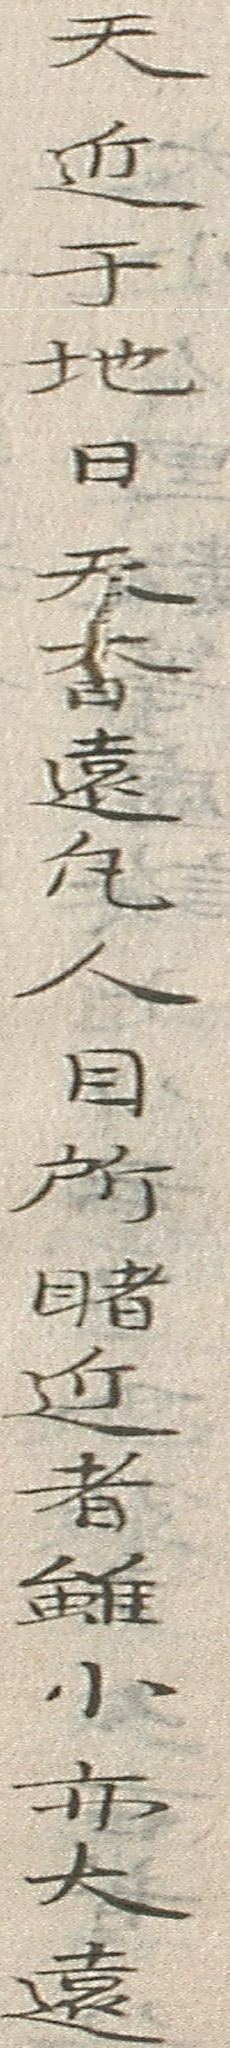天近于地日天大日遠凡人目所睹近者雖小亦大遠
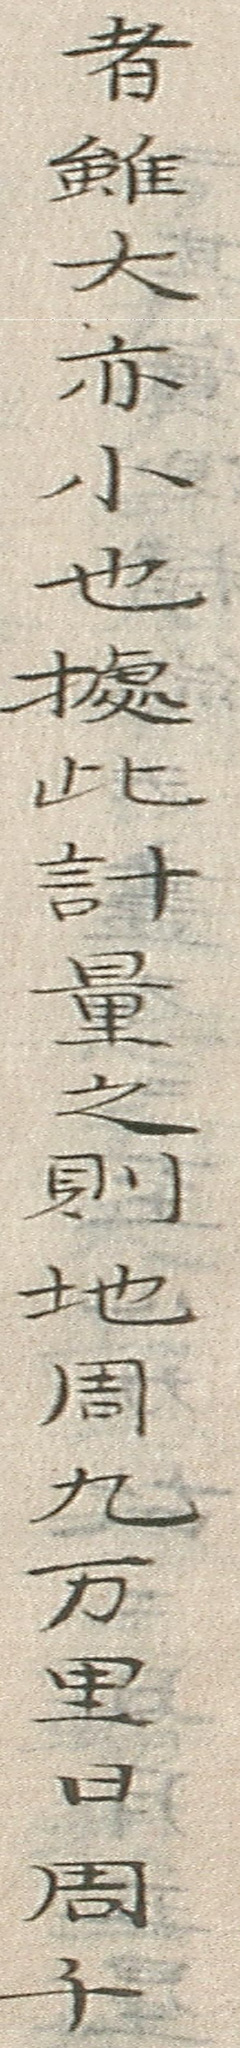者雖大亦小也拠此計量之則地周九万里日周千
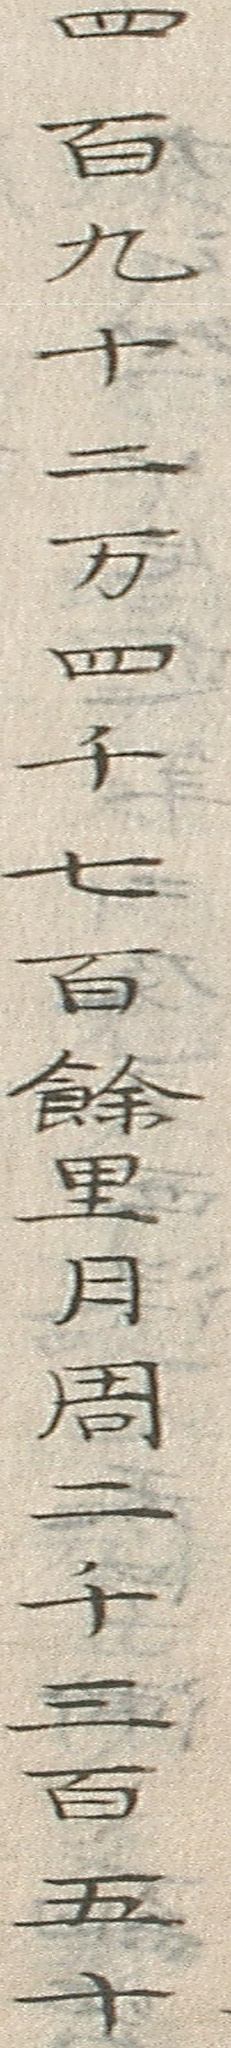四百九十二万四千七百余里月周二千三百五十
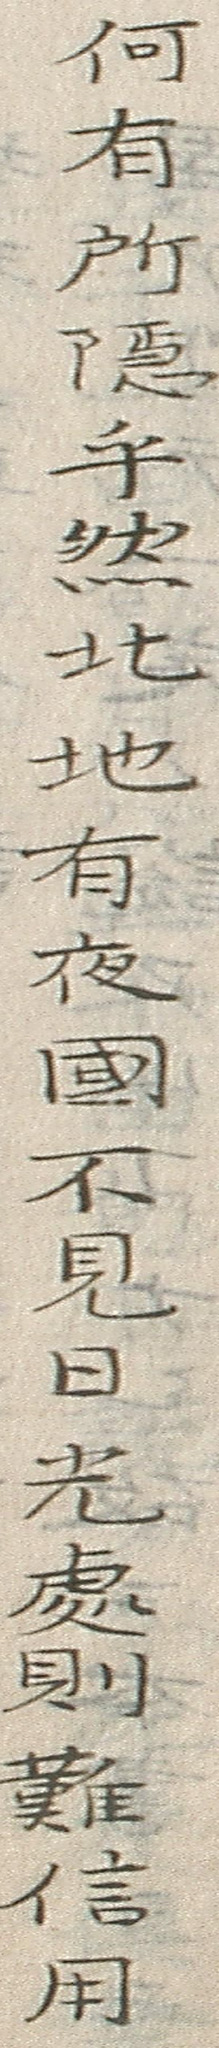何有所隠乎然北地有夜国不見日光処則難信用
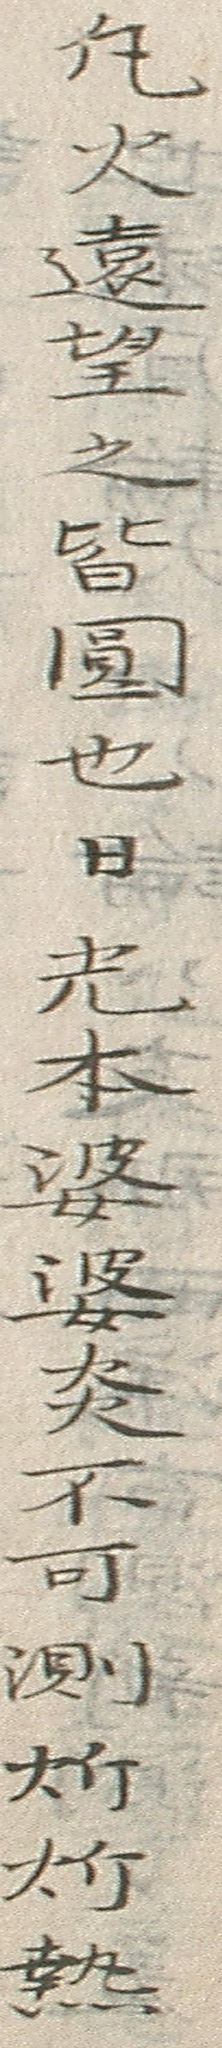凡火遠望之皆円也日光本婆婆炎不可測炘炘熱
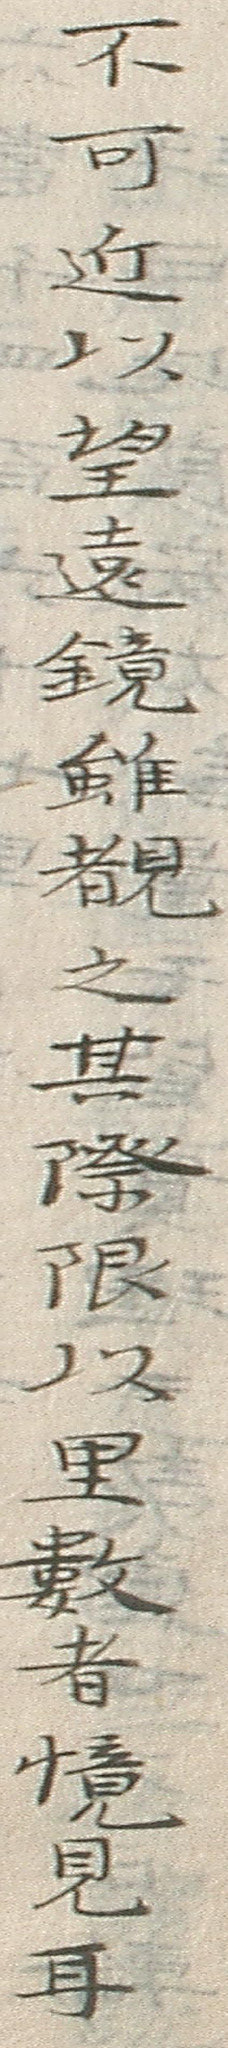不可近以望遠鏡雖覩之其際限以里数者？見耳
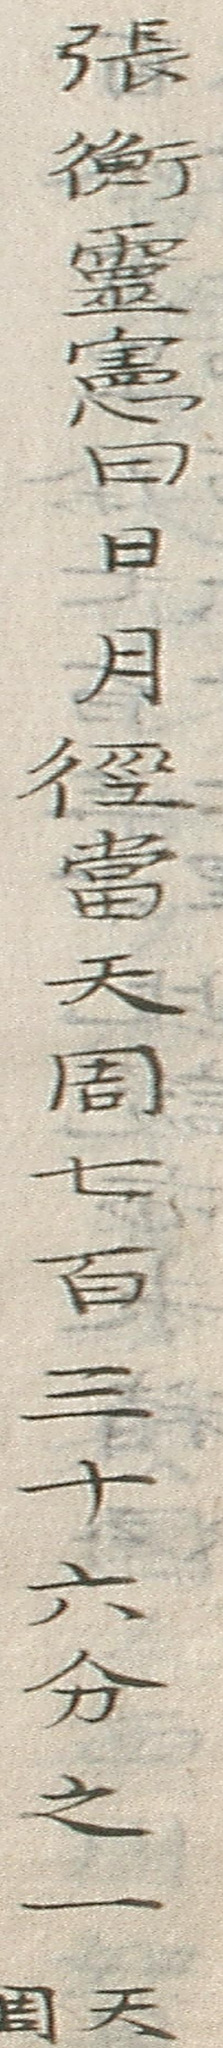張衡霊憲曰日月経当天周七百三十六分之一天周

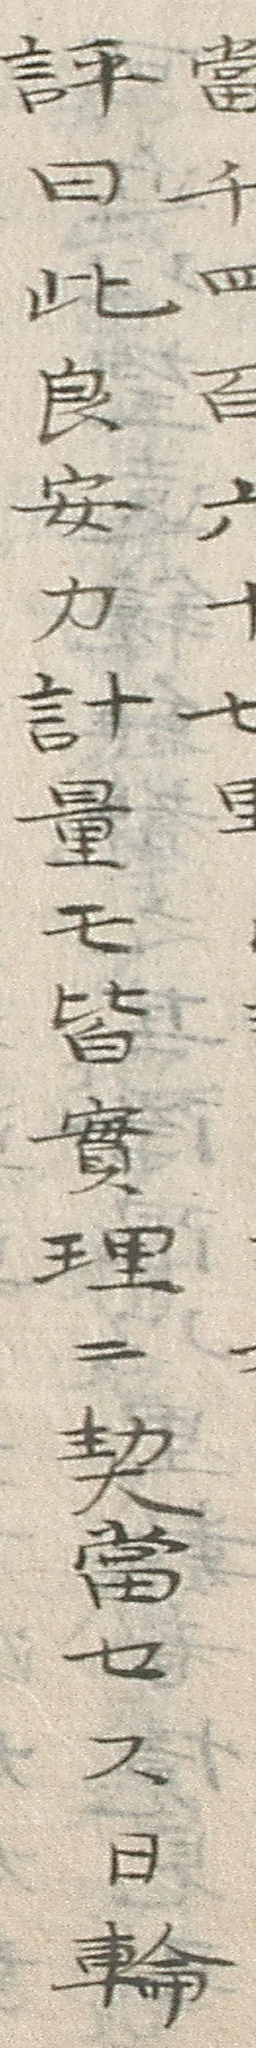評曰此良安カ計量モ皆実理ニ契当セス日輪
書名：天學略名目羽翼　全
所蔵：東京大学地震研究所図書室 Earthquake Research Institute Library, The University of Tokyo, JAPAN
